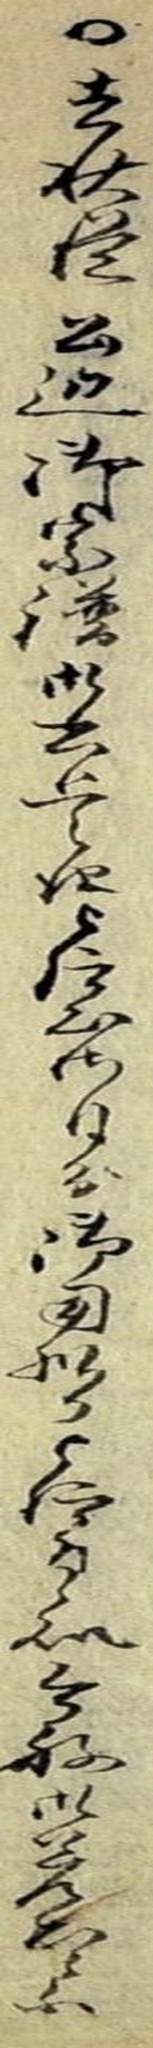○去秋従公辺御家譜御書上之儀被仰出御自分御用掛り被仰付候処今般御差出に不
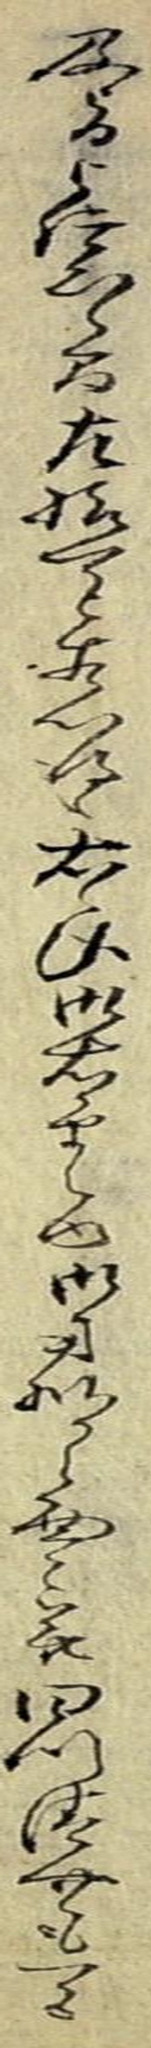及旨被仰出候間左様可被相心得候右之趣御右筆之内御用掛り之面々并田川清介へも可被
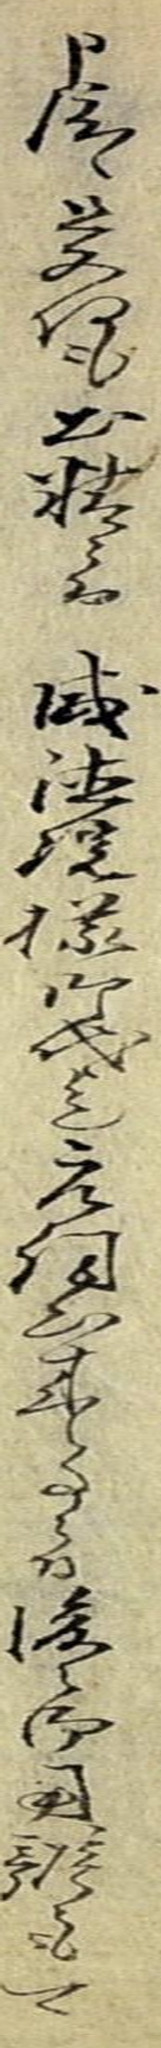申渡候且又何も出精に而威徳院様御代迄取調出来候事に付後々御用弁にも可
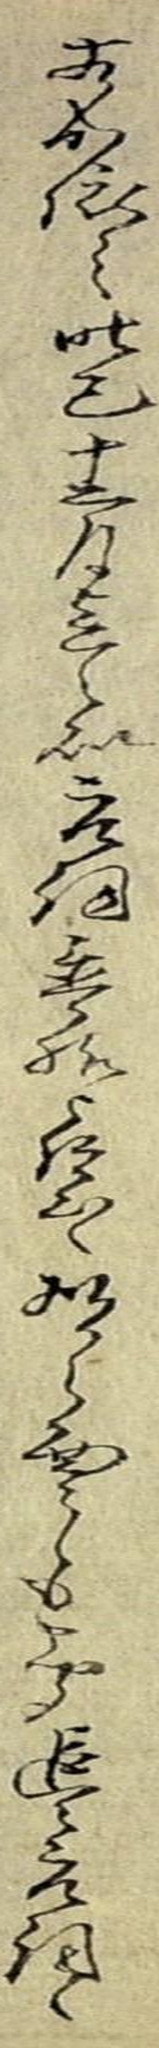相成候依之昨巳十二月迄之処取調置候様被仰出候掛り之面々も申聞追々取調候
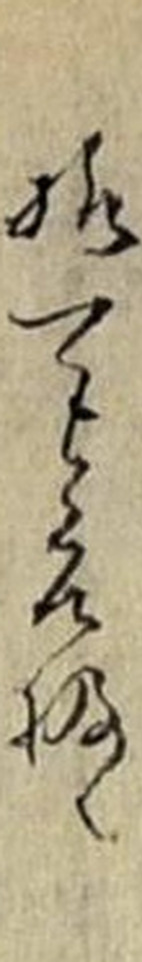様可被取扱候
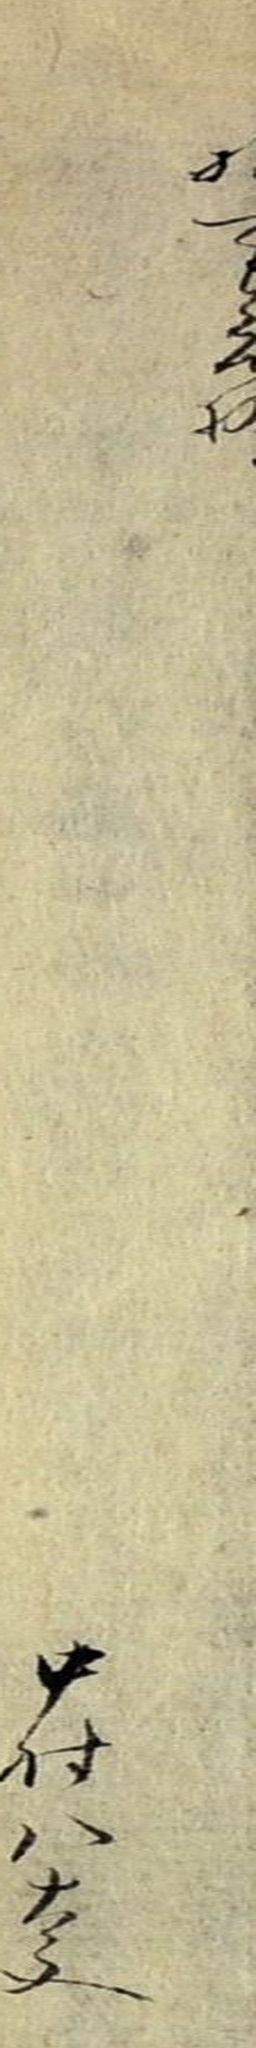中村八太夫
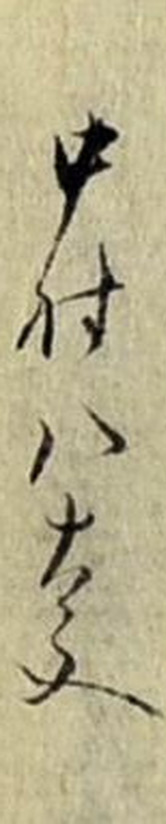中村八太夫
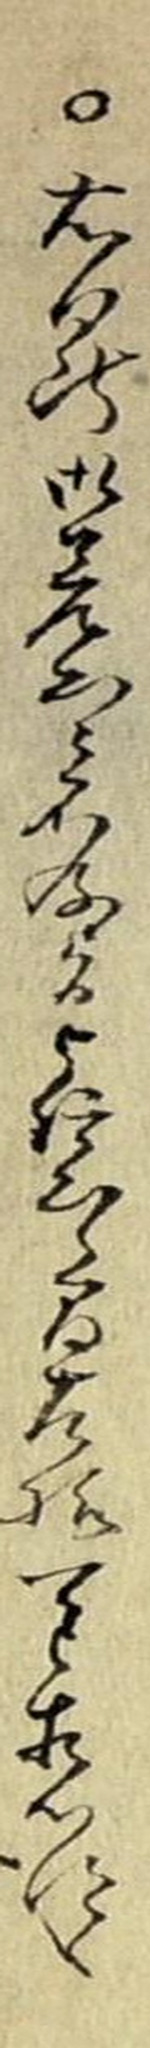○右同断御差出に不及旨被仰出候間左様可被相心得候
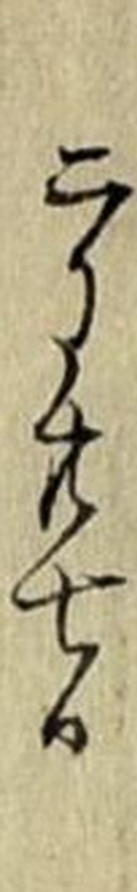二月廿七日
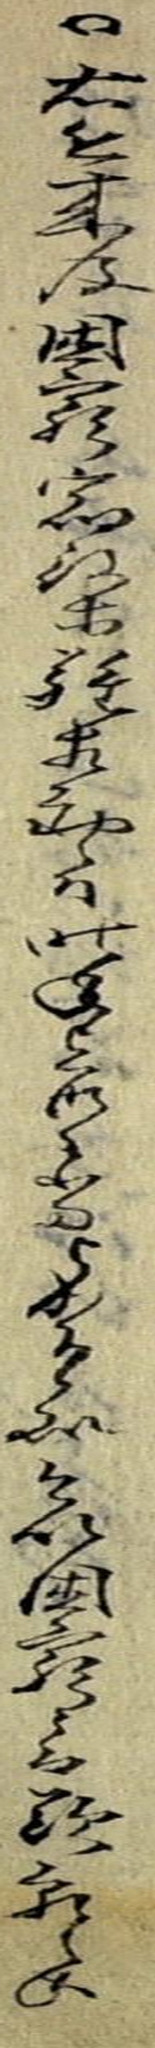○右近来及困窮宿役等難相勤に付昨年迄御手当被成下候処今以困窮に而歎願之趣
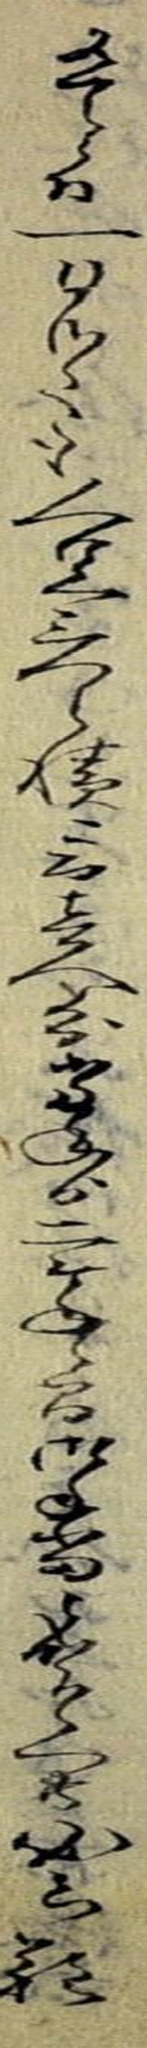有之候に付一日弐匁つヽ人足三人之積に而壱人分当年ゟ二ヶ年之間御手当被成下候へ共必至難
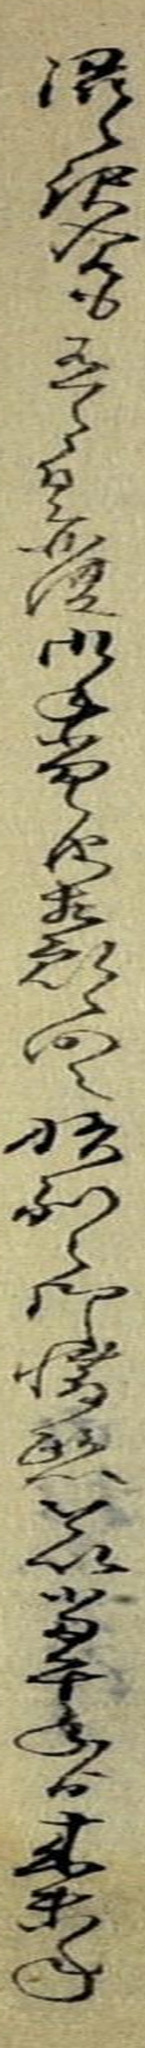渋之訳合も有之候に付亦復御手当之儀相願候仍之格外之御憐愍を以当午年ゟ来未年
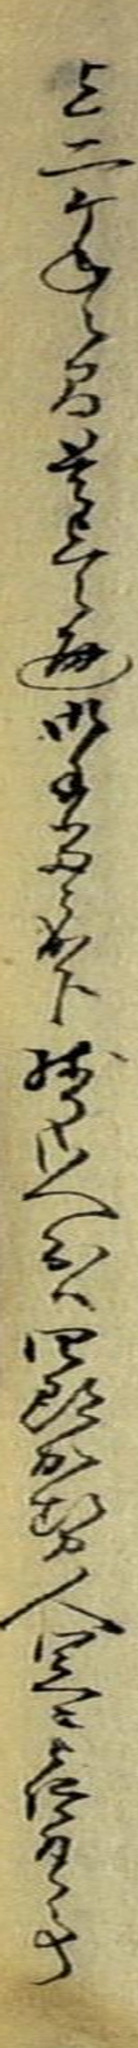迄二ヶ年之間是迄之通御手当被成下残り弐人分は四郡加勢人足被仰付候事
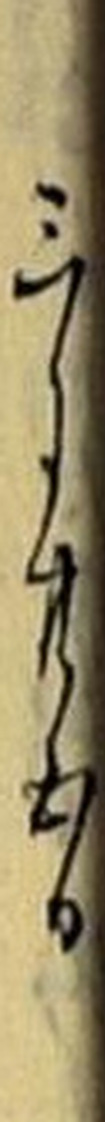三月廿五日
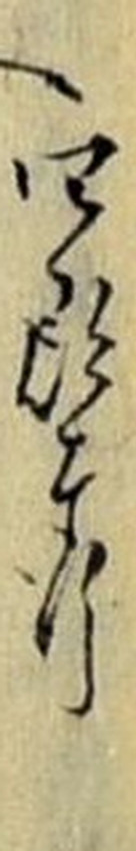四郡奉行
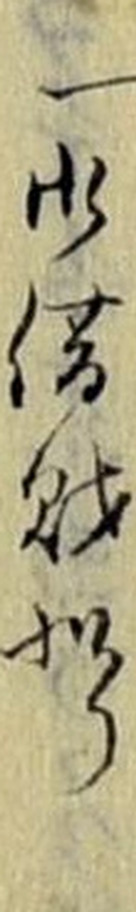御借財掛り
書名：命令之部 六
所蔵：福井県文書館 Fukui Prefectural Archives
